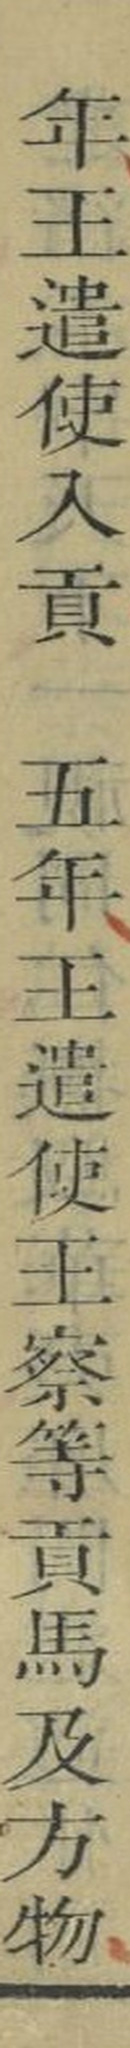年王遣使入貢五年王遣使王察等貢馬及方物
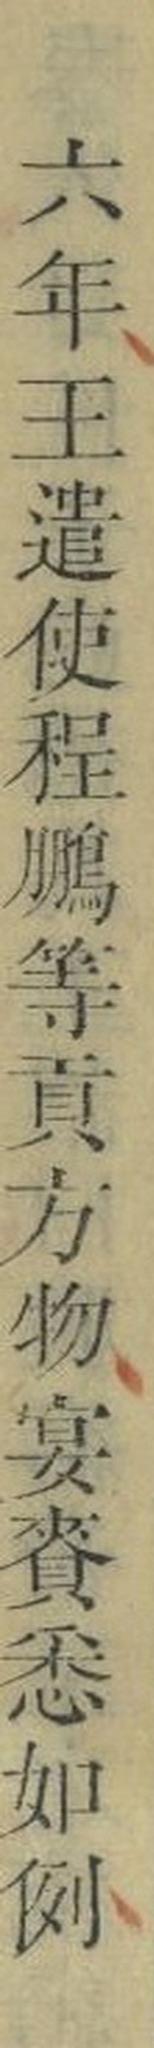六年王遣使程鵬等貢方物宴賚悉如例
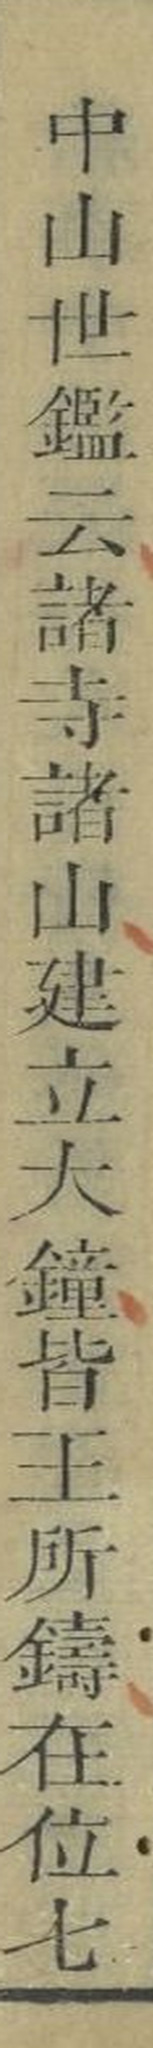中山世鑑云諸寺諸山建立大鐘皆王所鋳在位七
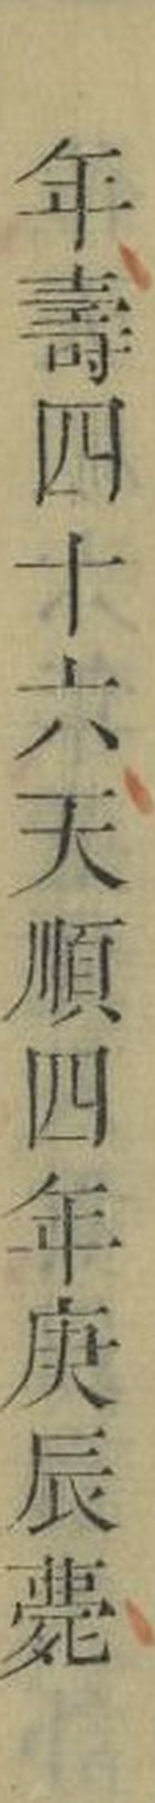年寿四十六天順四年庚辰薨
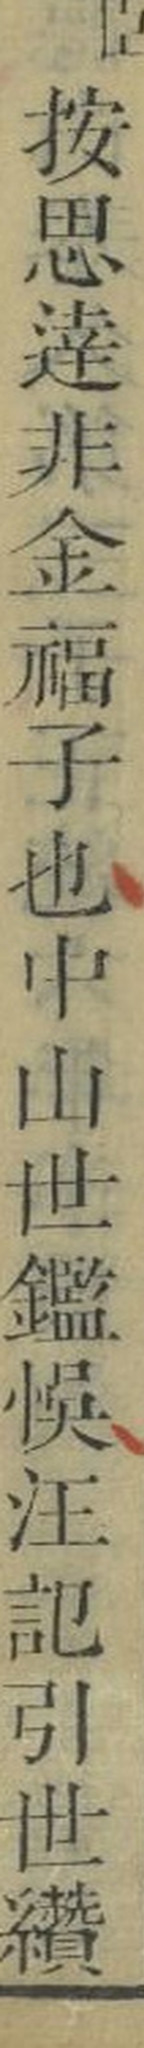臣按思達非金福子也中山世鑑悞汪記引世纘
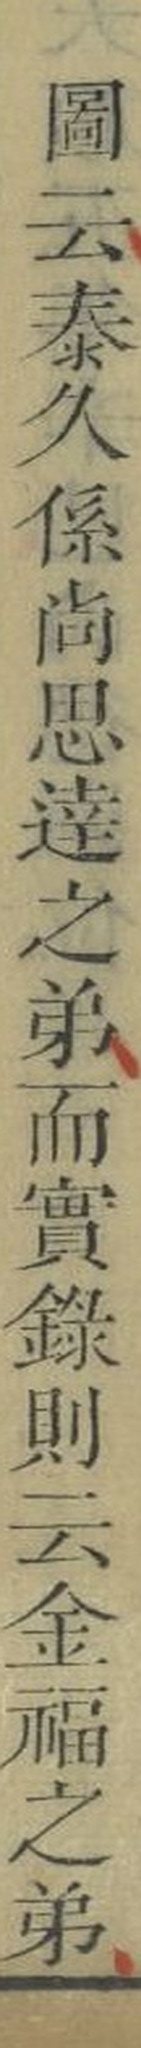図云泰久係尚思達之弟而実録則云金福之弟
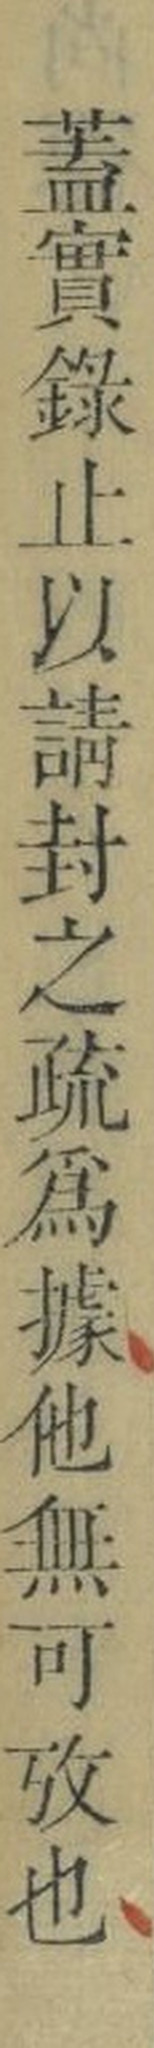蓋実録止以請封之疏為拠他無可攷也

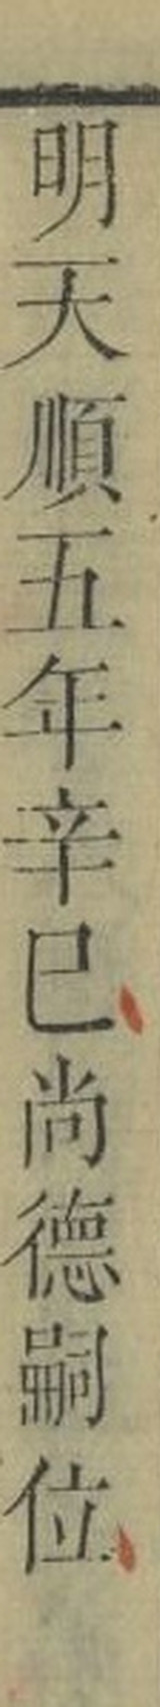明天順五年辛巳尚徳嗣位
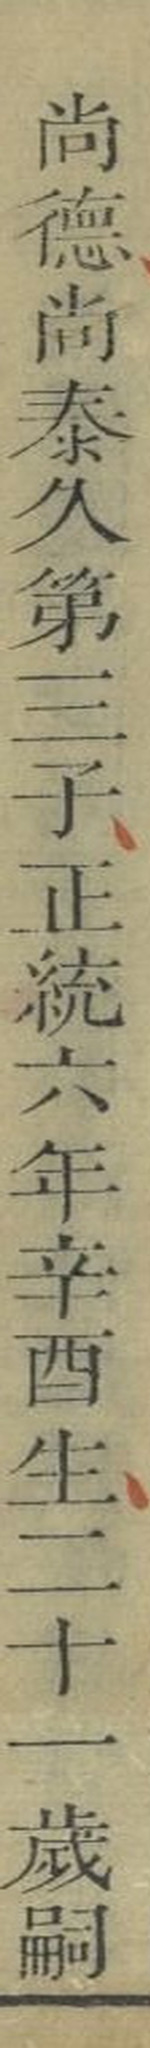尚徳尚泰久第三子正統六年辛酉生二十一歳嗣
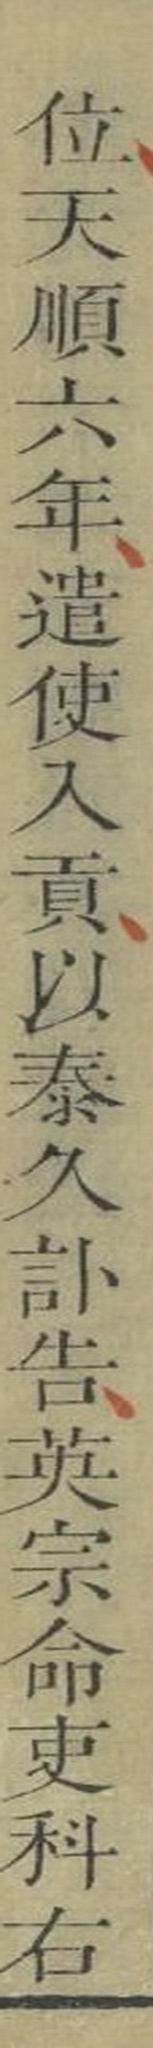位天順六年遣使入貢以泰久訃告英宗命吏科右
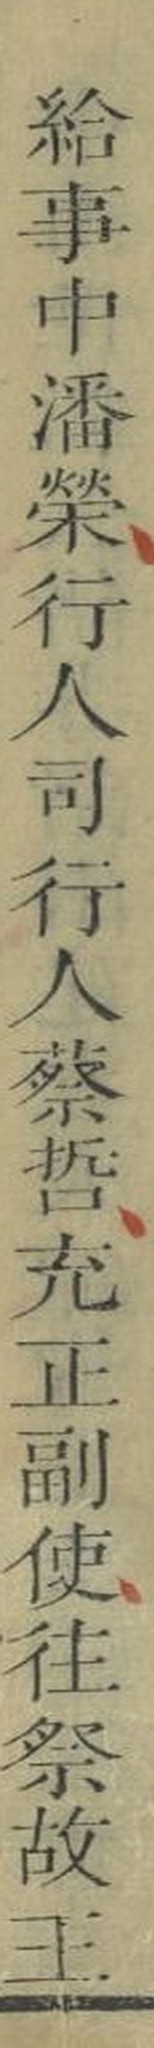給事中潘栄行人司行人蔡哲充正副使往祭故王
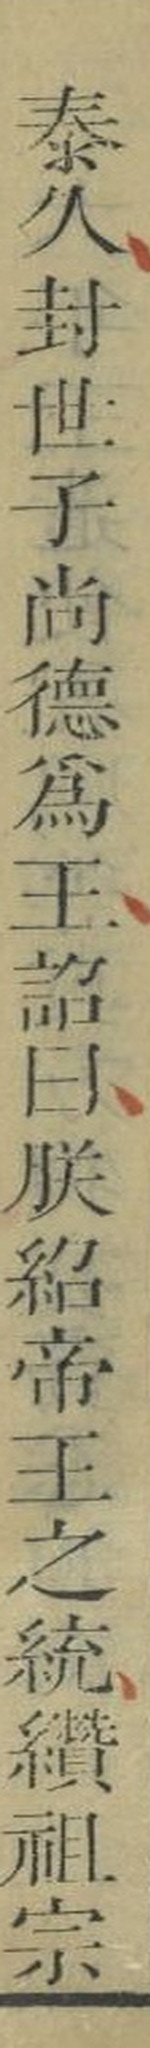泰久封世子尚徳為王詔曰朕紹帝王之統纘祖宗
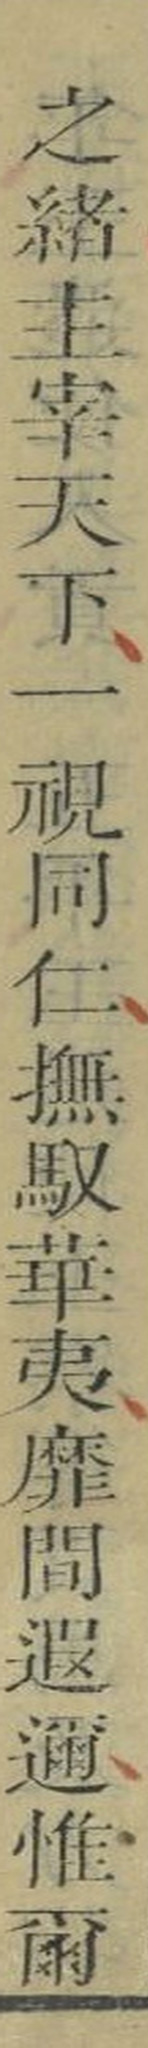之緒主宰天下一視同仁撫馭華夷靡間遐邇惟爾
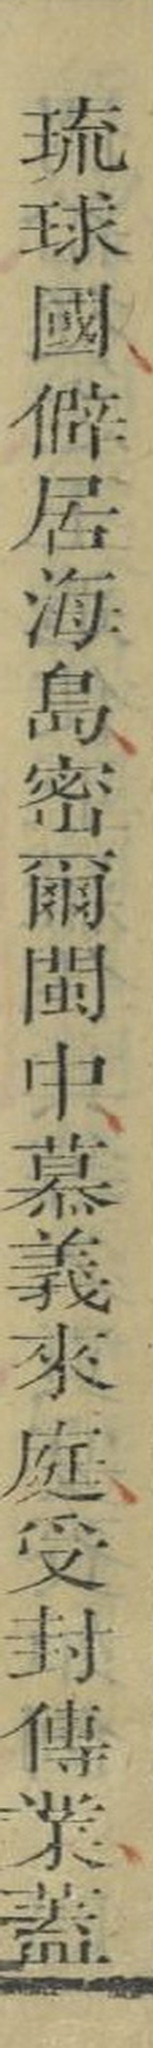琉球国僻居海島密爾閩中慕義来庭受封伝業蓋
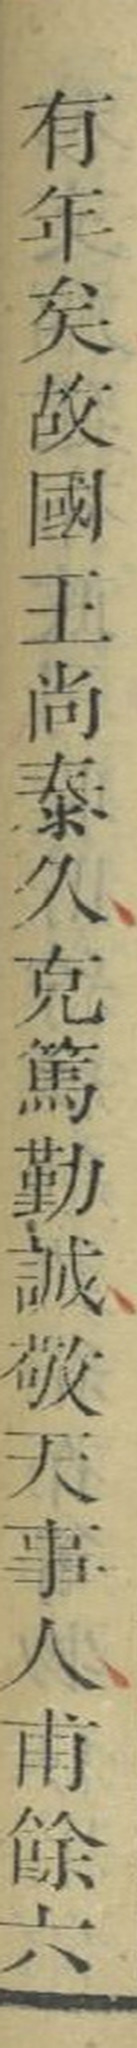有年矣故国王尚泰久克篤勤誠敬天事人甫余六
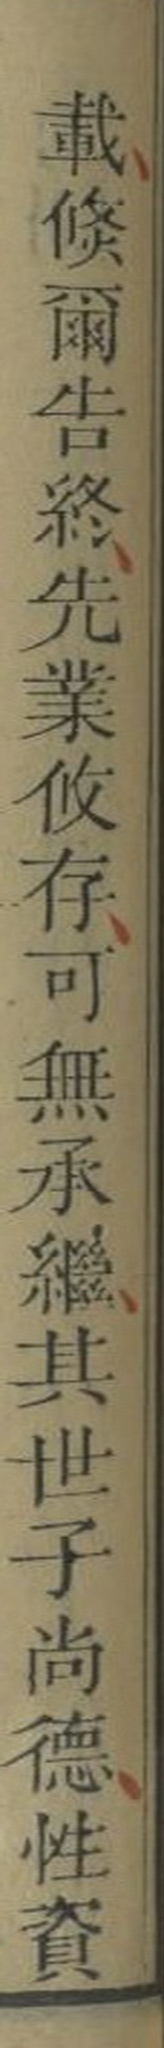載倏爾告終先業攸存可無承継其世子尚徳性資
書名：中山伝信録 巻三
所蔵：University of the Ryukyus Library
